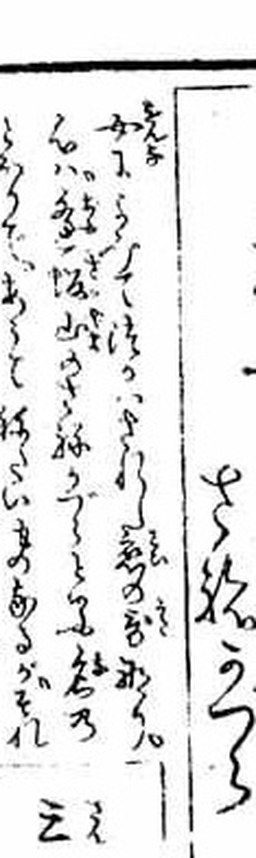女によみてつかはされし恋の哥なり
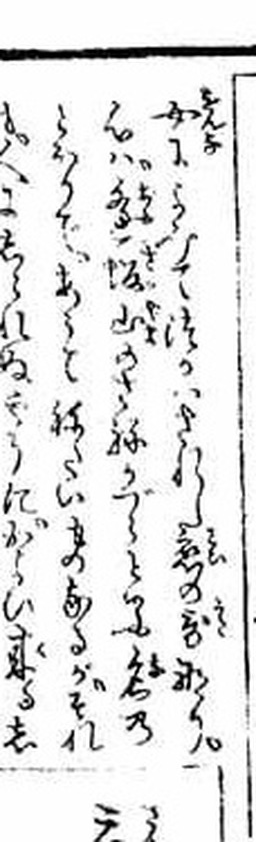心は逢坂山のさねかづらといふ名の
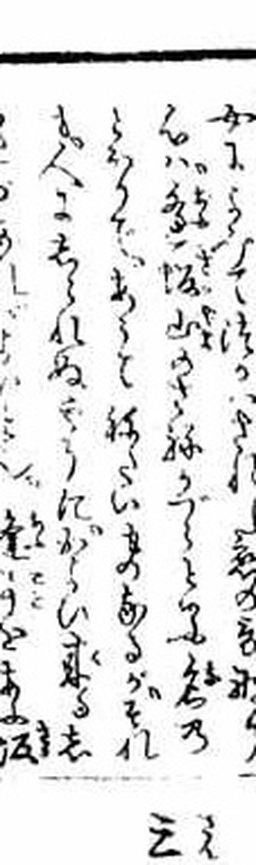とほりであうとねたいものなるがそれ三
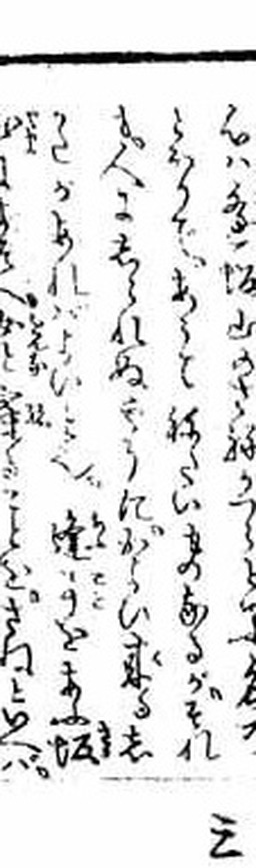も人にしられぬやうにかよひ来る条
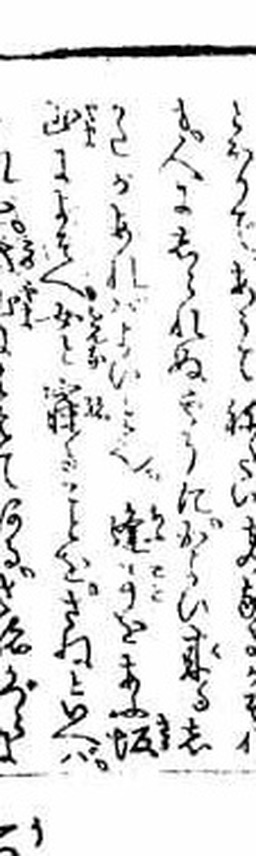かたがあればよいと也あふ事をあふ坂
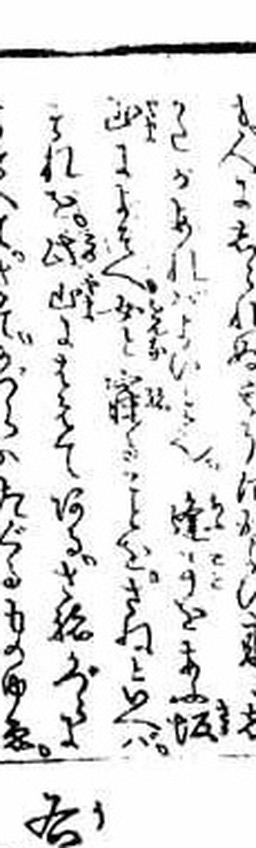山によそへ女と寝ることをさねといへば
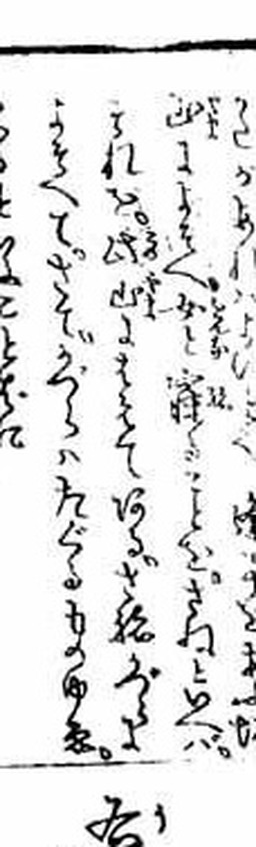これを此山にはえていあるさねかづらに右
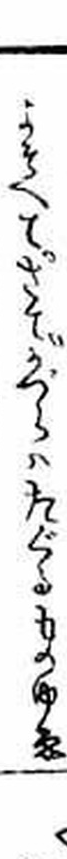よそへてさてかづらはたぐるものゆゑ大
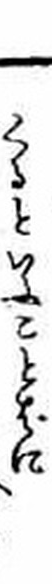くるといふことばに臣
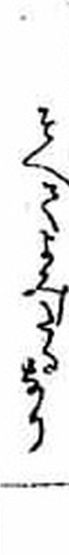へてよみしたるなり

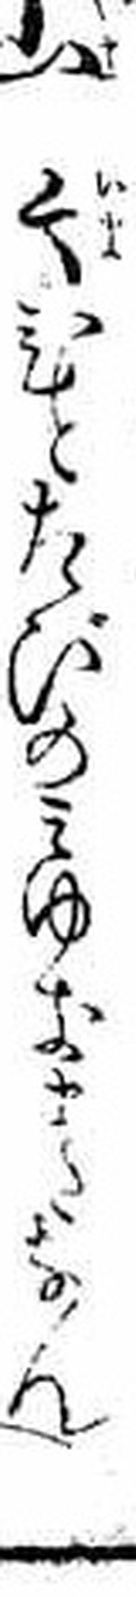山今ひとたびのみゆきまたなん
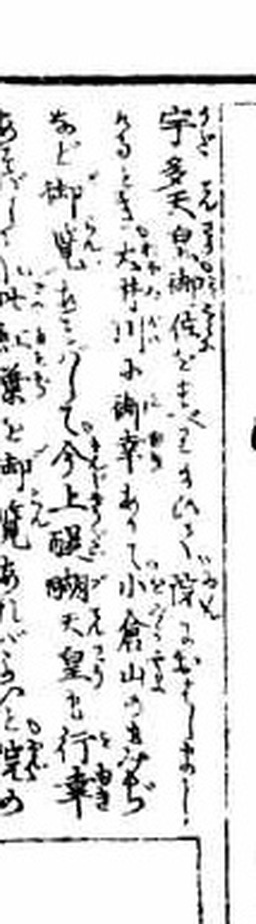けるとき大井川に御幸さりて御座山のもみぢ
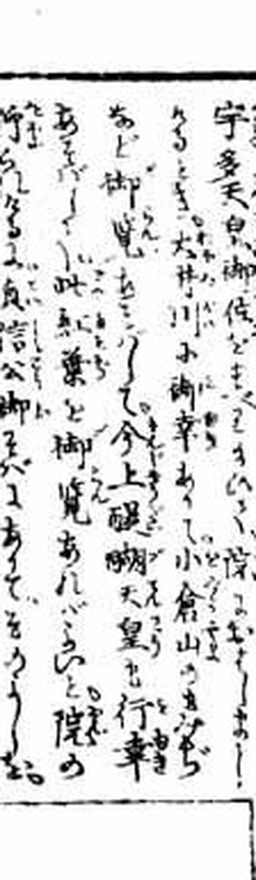など御覧あそばして今上醍醐天皇も行幸
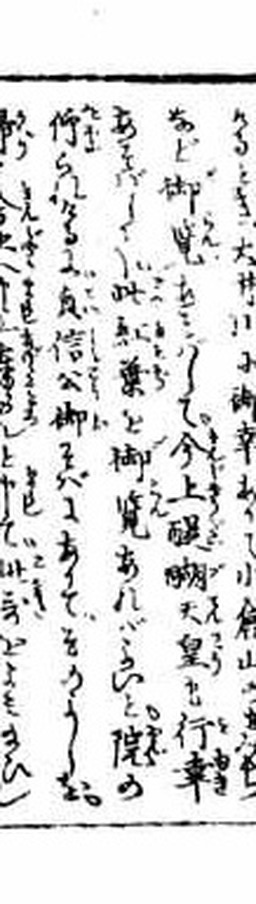あそばして此紅葉をご覧あればよいと院の
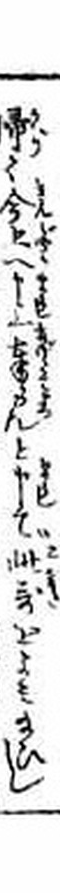帰て今上へ申上奉らんと申て此哥をよみ給ひし
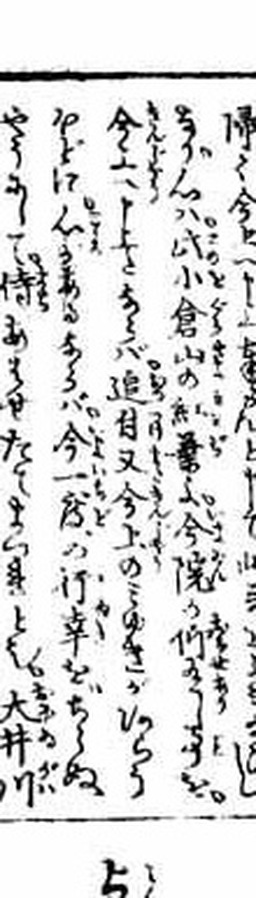今上へ申上たならば追付又今上のみゆきがあらう貞
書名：小倉百人一首
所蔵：東京学芸大学教育コンテンツアーカイブ
